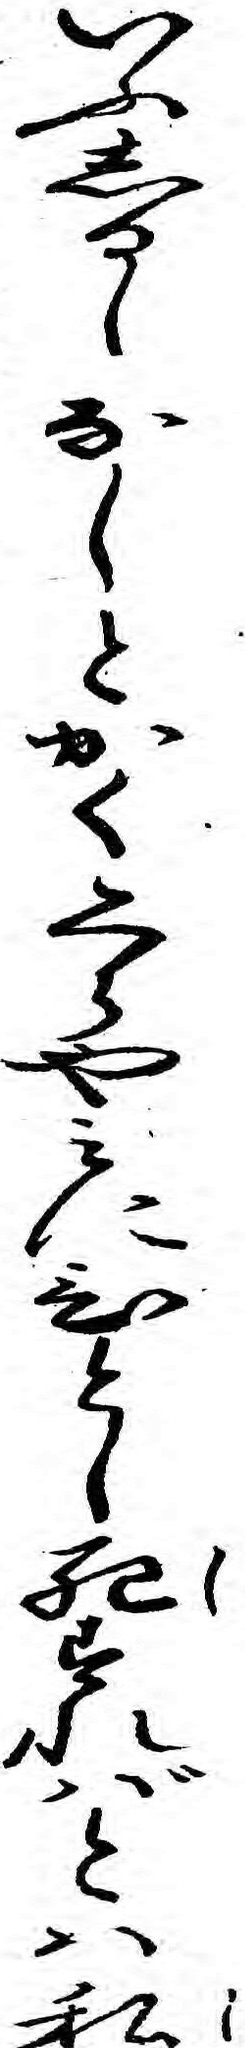いふしるしなしとかくくらやみにひとし死すればとは私
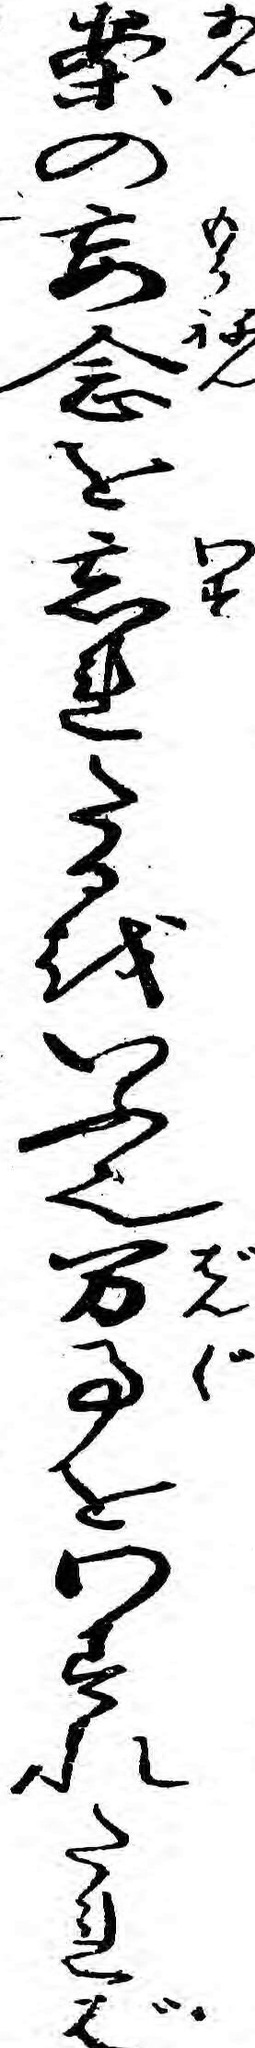案の妄念を忘れたるをいふ也万事をわすれたれば
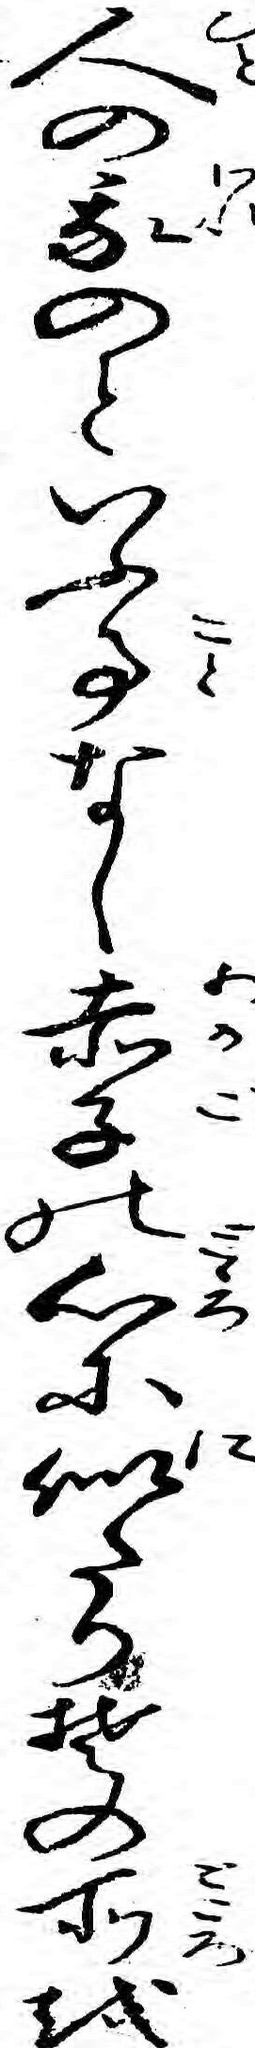人の我のといふ事なし赤子の心に似たりその所を
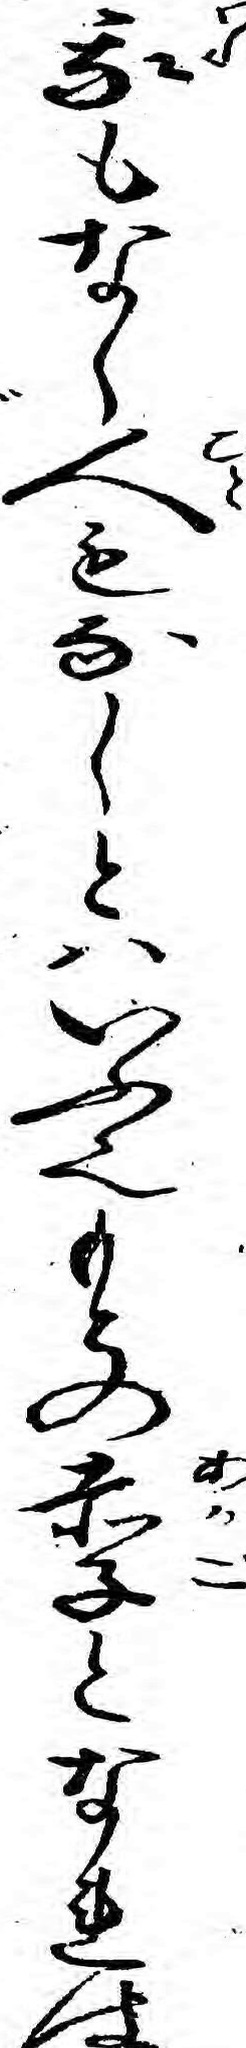我もなし人もなしとはいふ也もとの赤子となれは
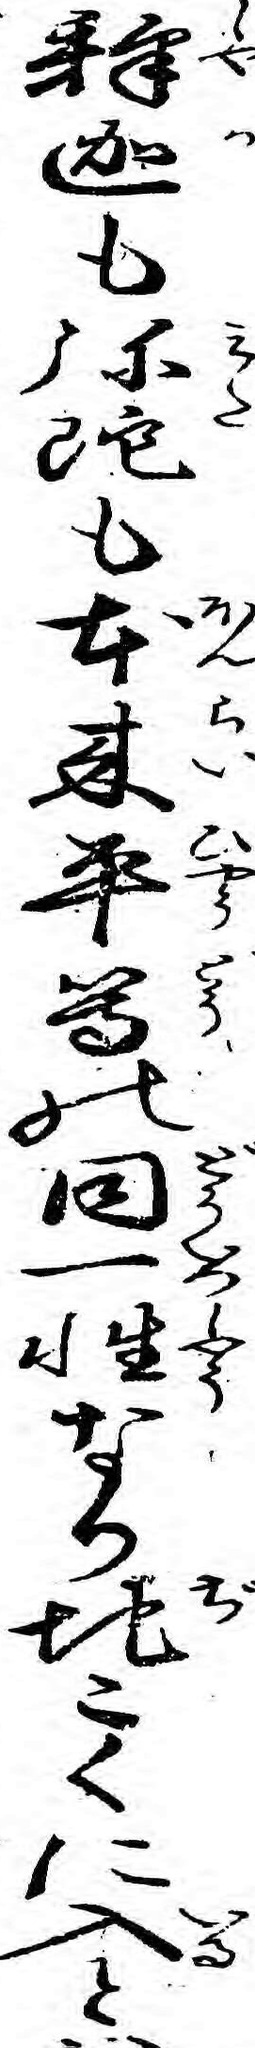釈迦も弥陀も本来平等の同一性なり地こくに入とは
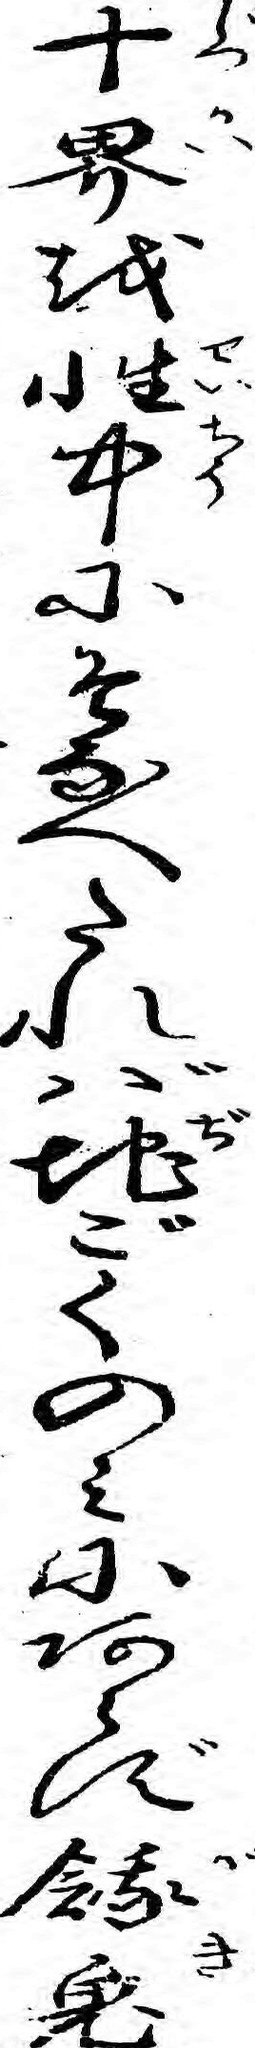十界を性中にそなへたれば地ごくのみにあらず餓鬼
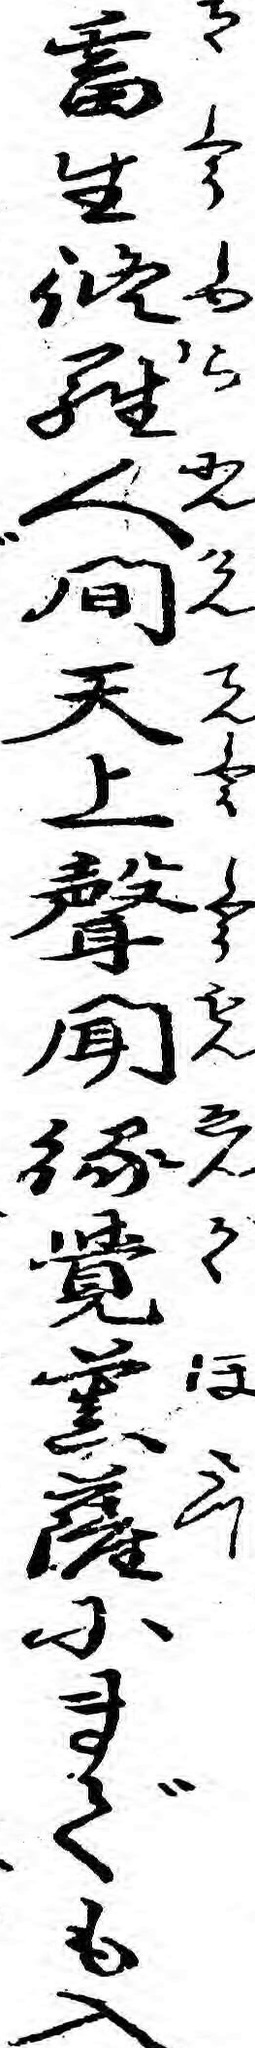畜生修羅人間天上声聞縁覚菩薩にまでも入
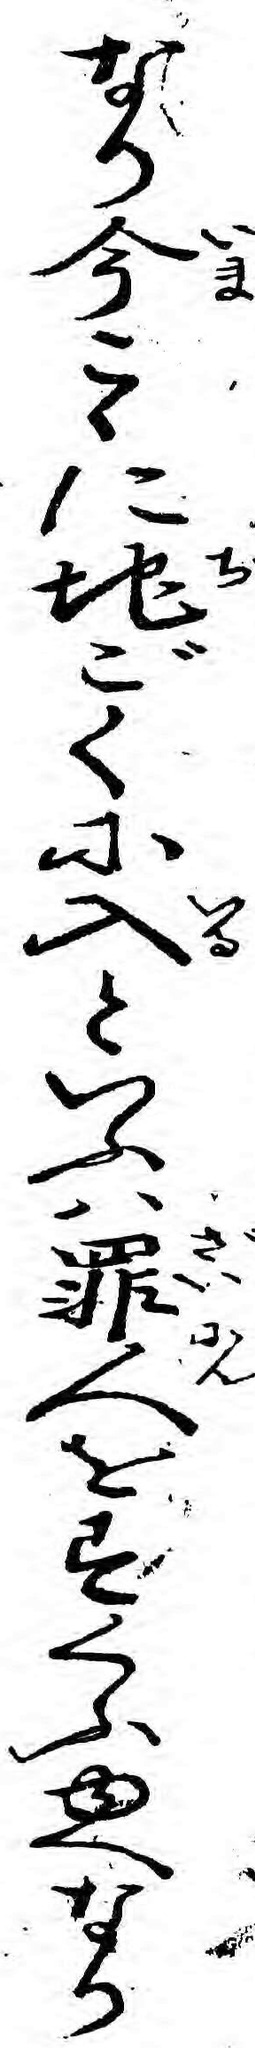なり今こゝに地ごくに入といふは罪人をすくふゆへなり
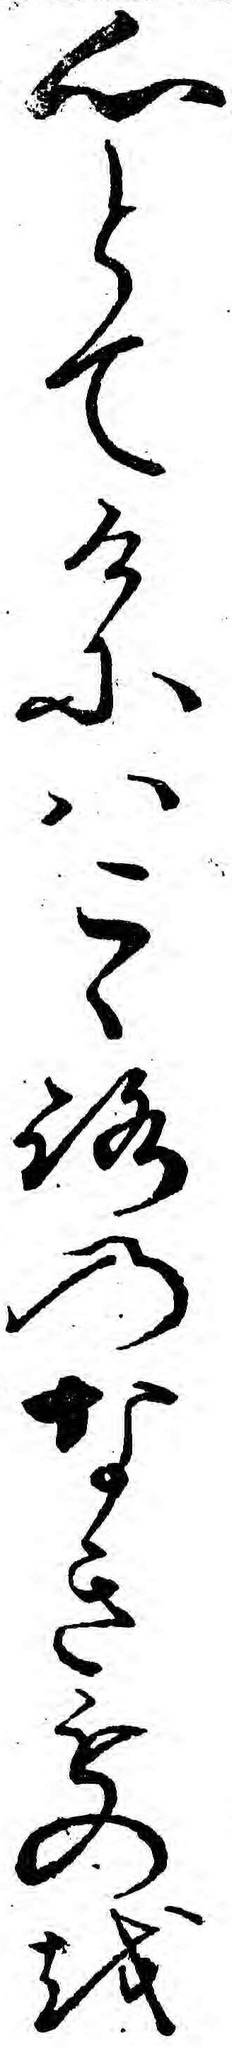心とてけにはこゝろのなきものを

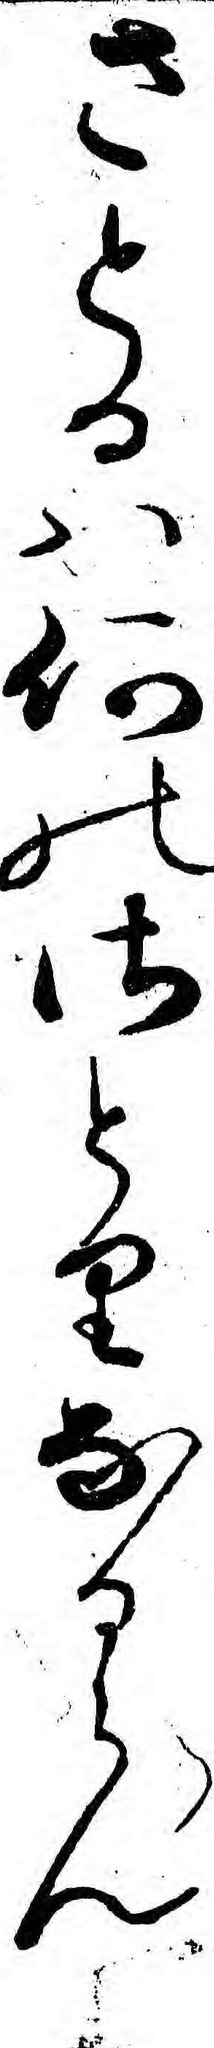さとるは何のさとりなるらん
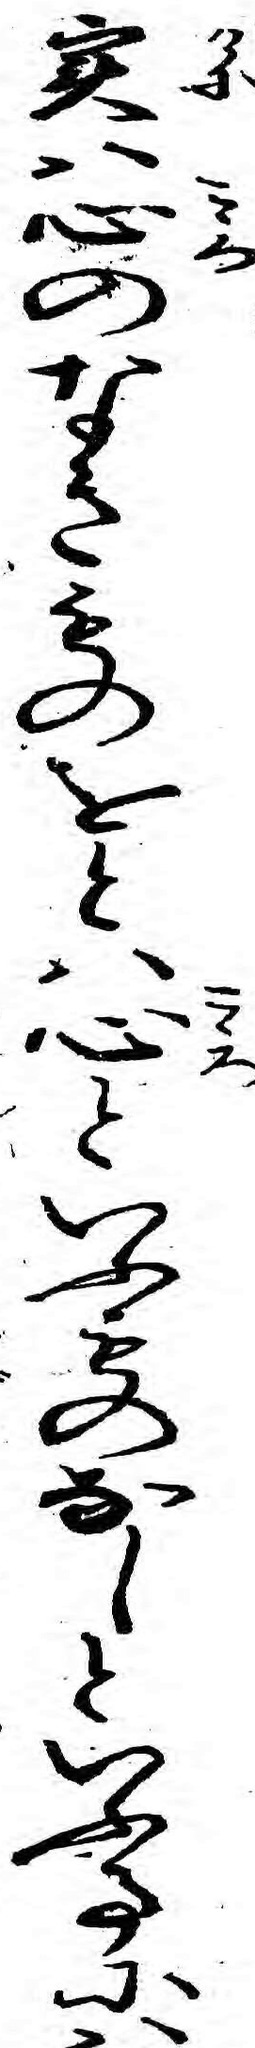実は心のなきものをとは心といふものなしといふ事には
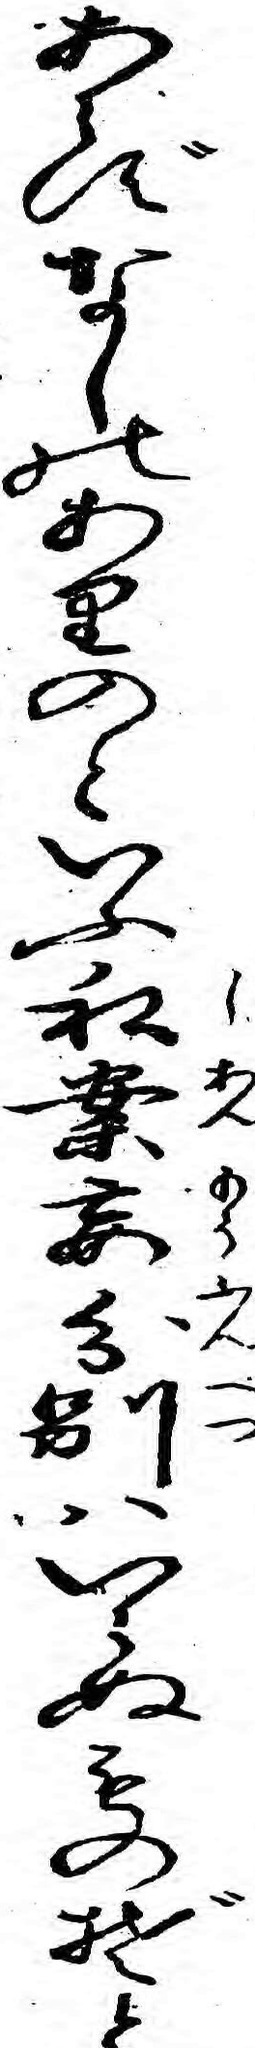あらずなしのありのといふ私案妄分別はいらぬものぞと
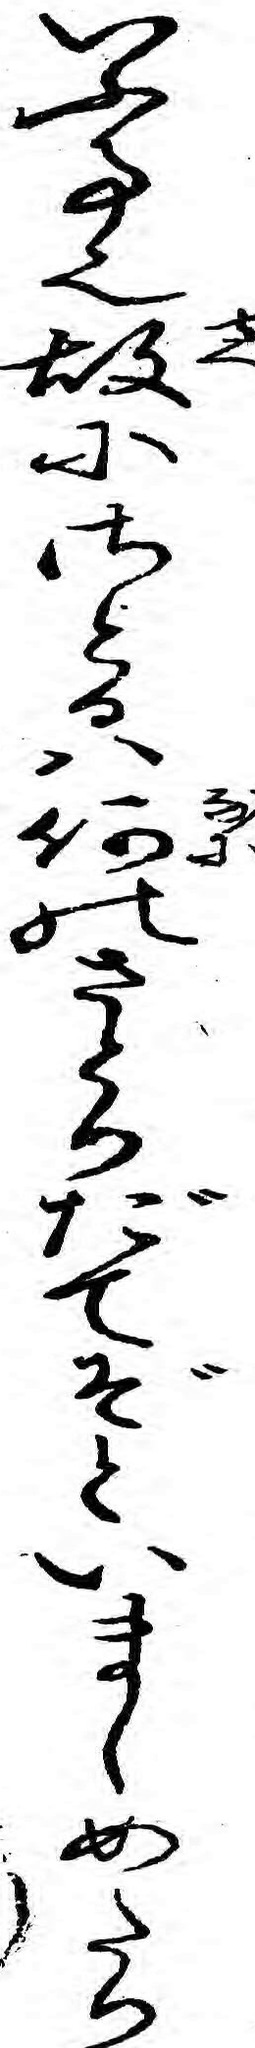いふ事也故にさとるは何のさとりだてぞといましめたり
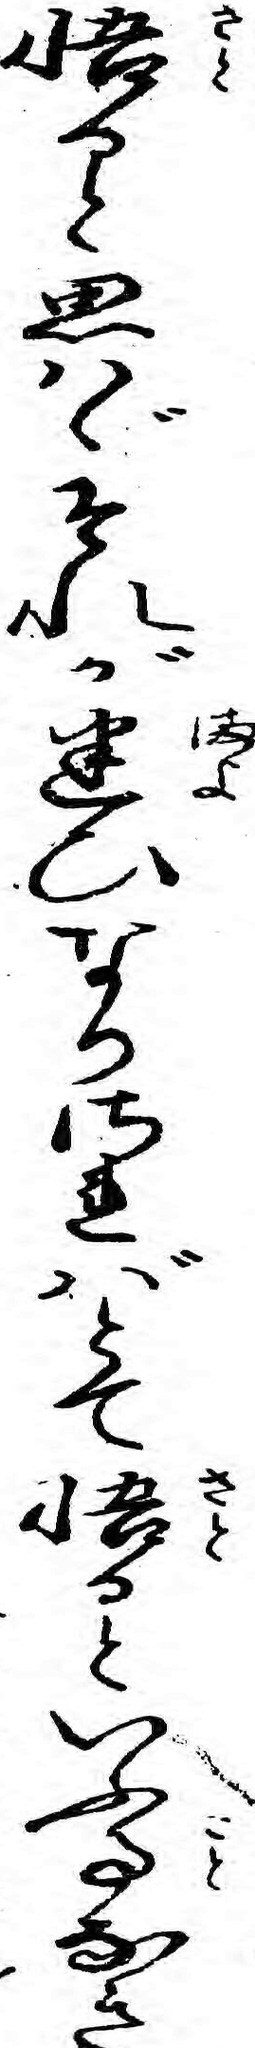悟ると思はゞそれが迷ひなりさればとて悟るといふ事なき
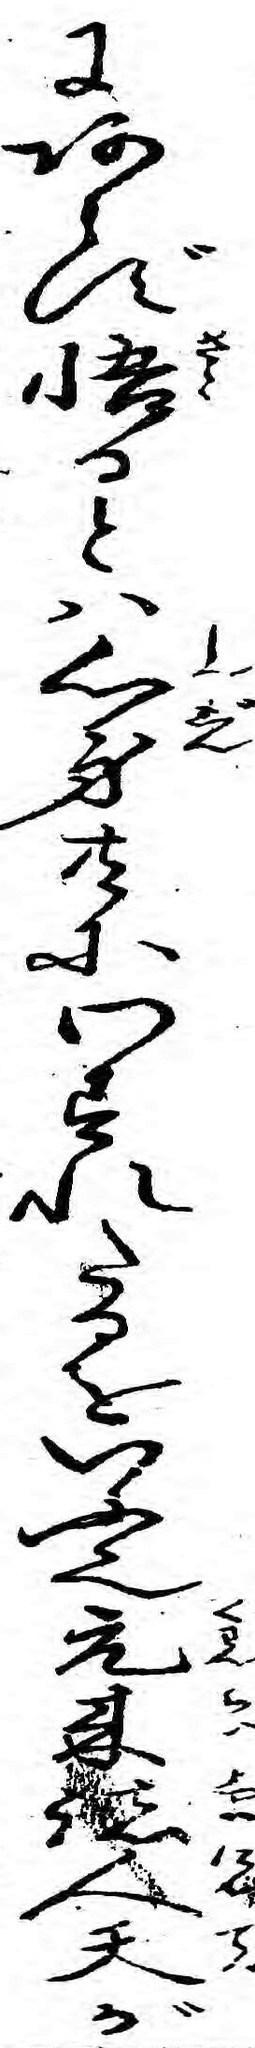にあらず悟るとは心身共にわすれたるをいふ也元来諸人天が
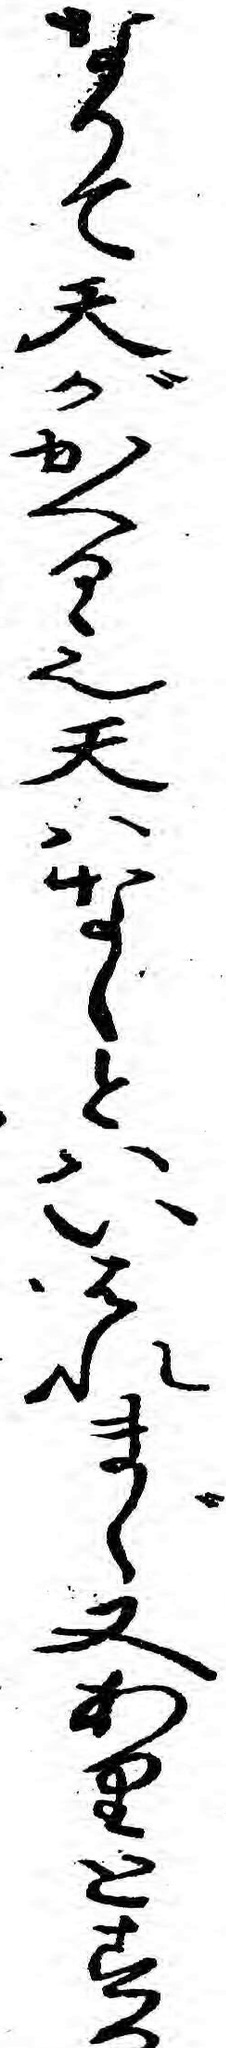なりて天がかくるゝ也天はなしとはいはれまじ又ありとする
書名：目なし用心抄
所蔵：国文学研究資料館
